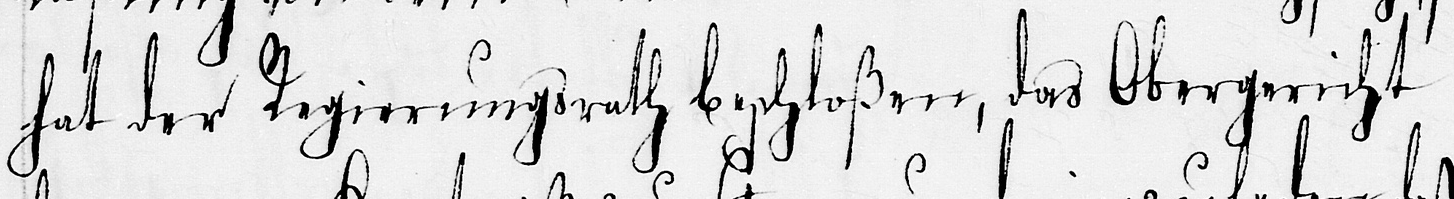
hat der Regierungsrath beschloßen, das Obergericht
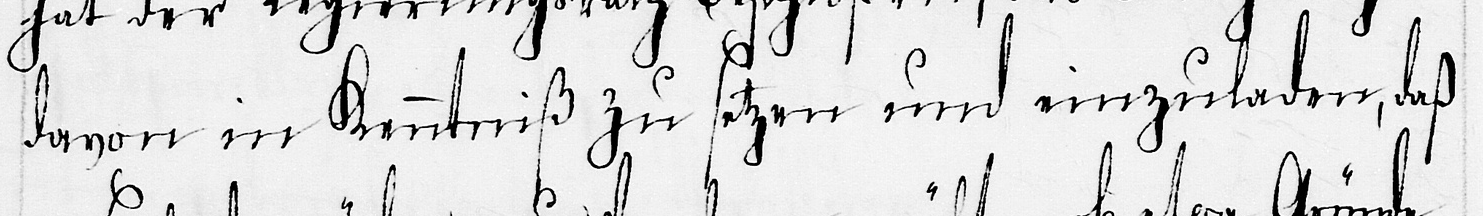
davon in Kenntniß zu setzen und einzuladen, daß
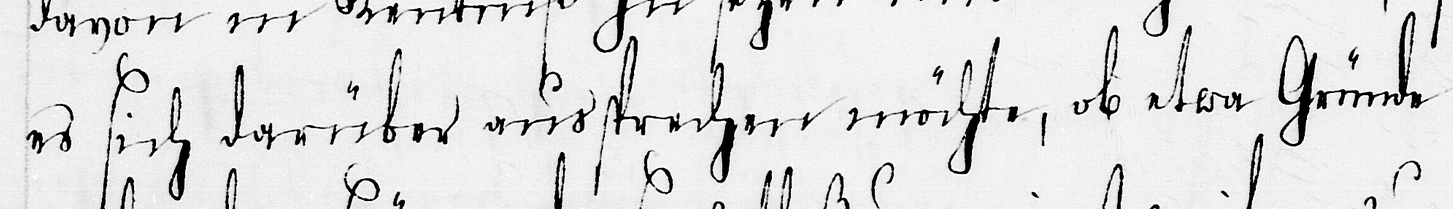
es sich darüber aussprechen möchte, ob etwa Gründe
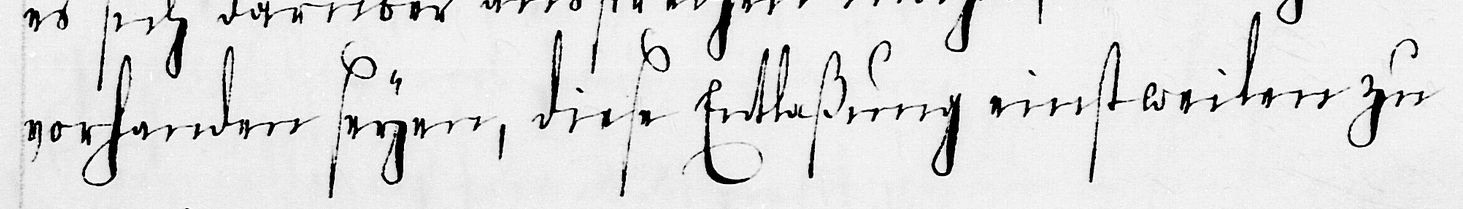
vorhanden seyen, diese Entlaßung einstweilen zu
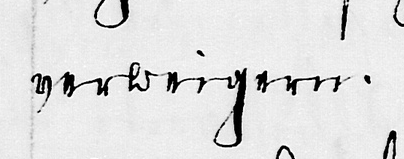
verweigern.
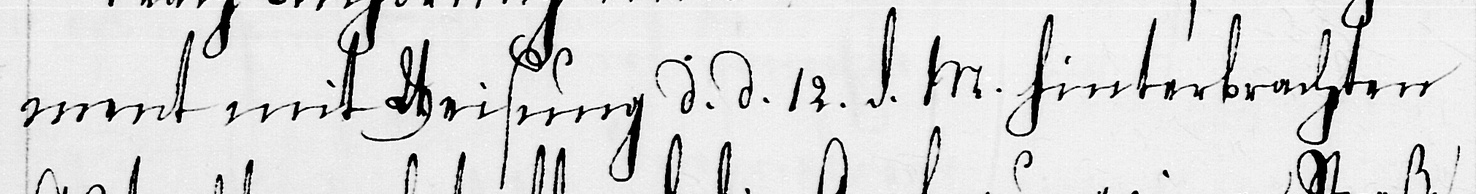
ment mit Weisung d. d. 12. d. M. hinterbrachten
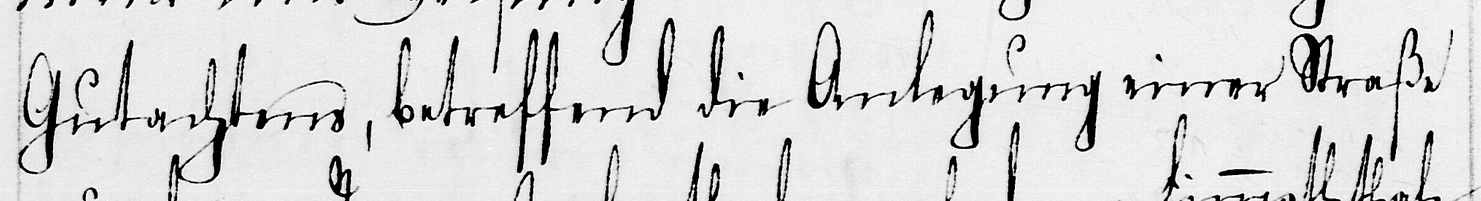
Gutachtens, betreffend die Anlegung einer Straße
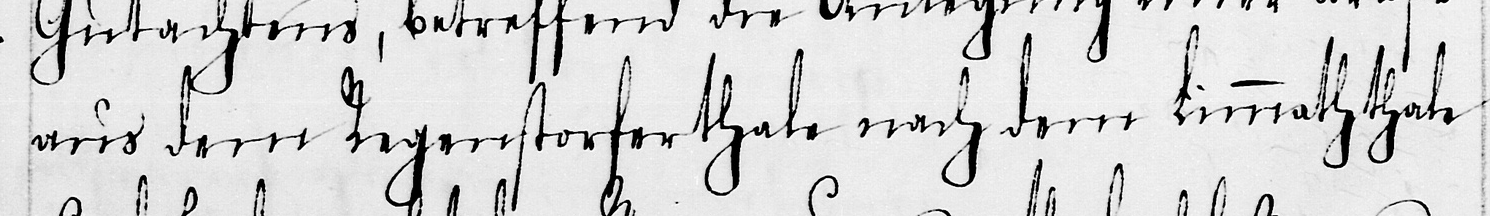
aus dem Regenstorferthale nach dem Limmaththale
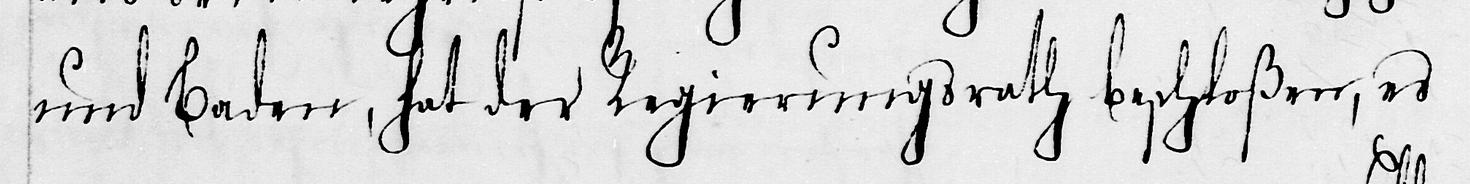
und Baden, hat der Regierungsrath beschloßen, es
